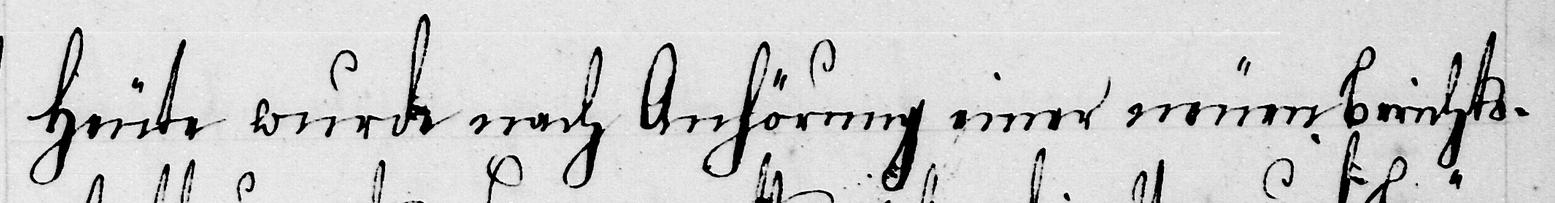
Heute wurde nach Anhörung einer neuen Berichts¬
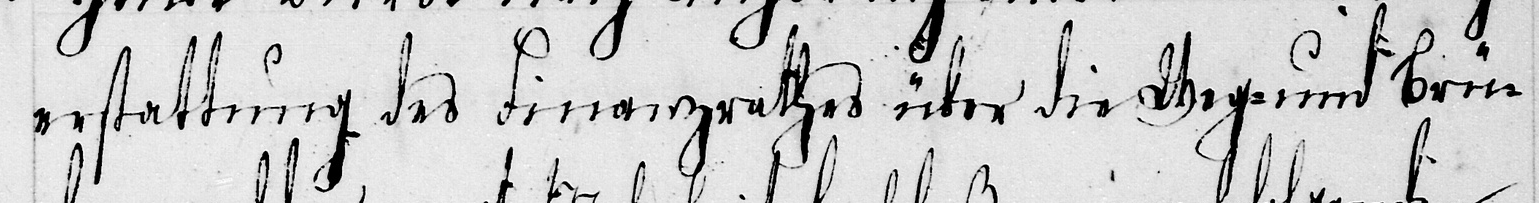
erstattung des Finanzrathes über die Weg- und Brü¬
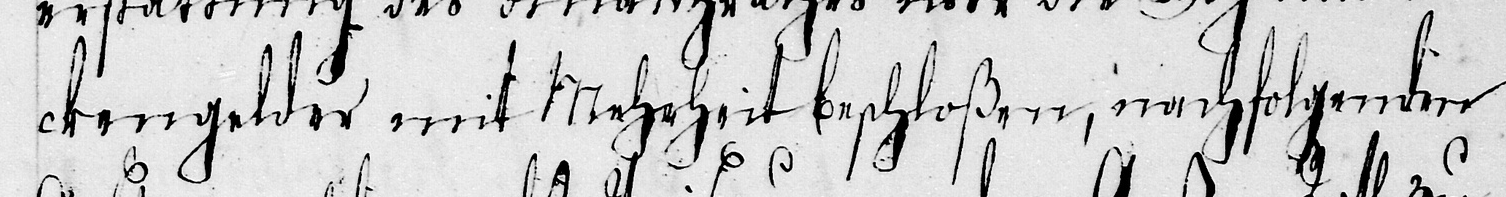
ckengelder mit Mehrheit beschloßen, nachfolgenden
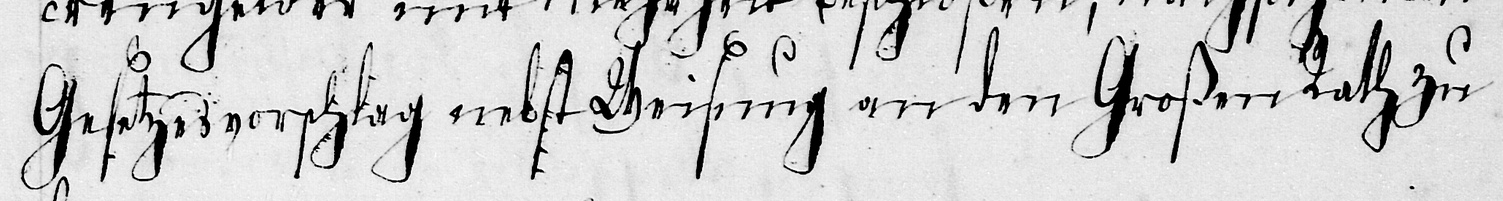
Gesetzesvorschlag nebst Weisung an den Großen Rath zu
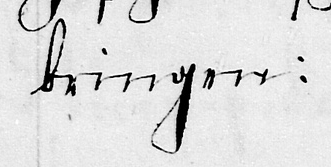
bringen:
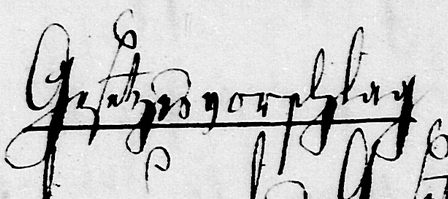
Gesetzesvorschlag
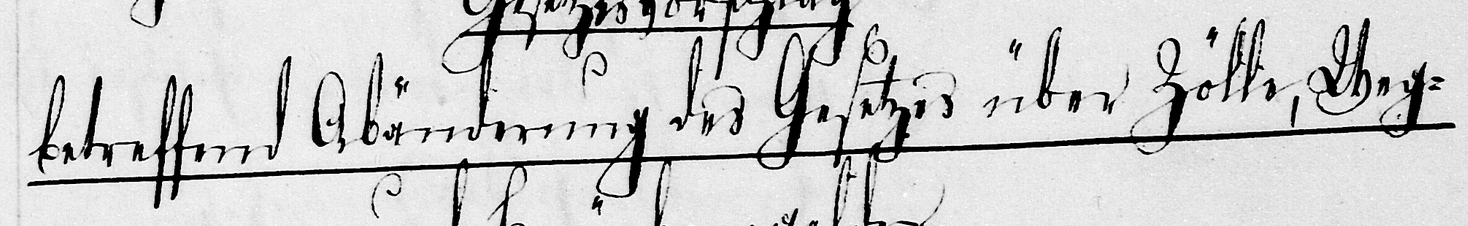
betreffend Abänderung des Gesetzes über Zölle, Weg-
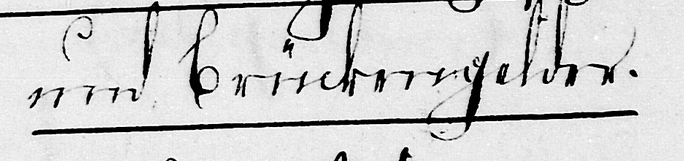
und Brückengelder.
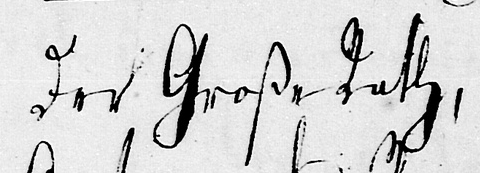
Der Große Rath,
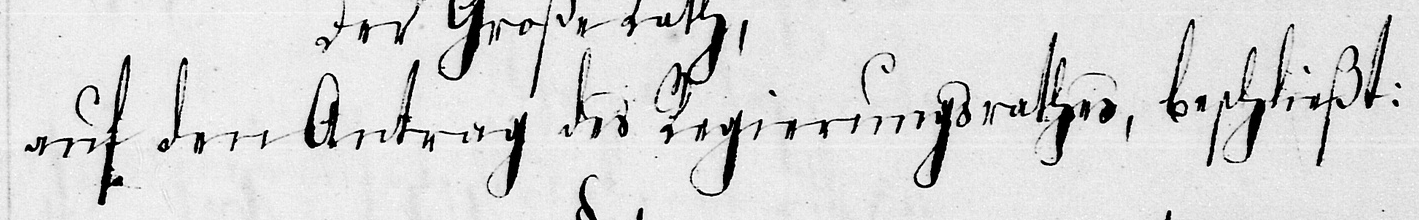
auf den Antrag des Regierungsrathes, beschließt:
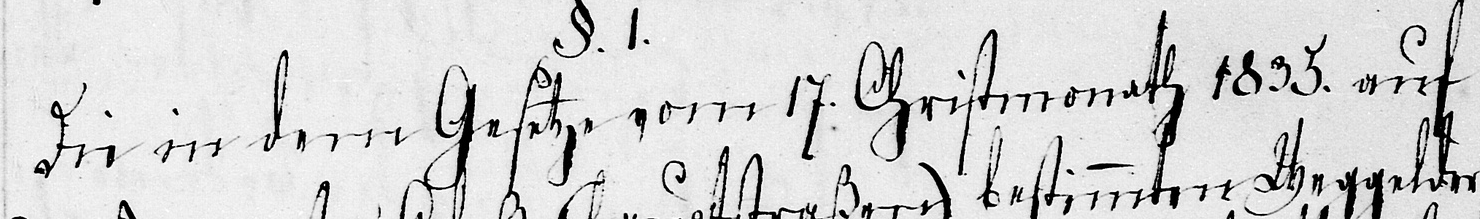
Die in dem Gesetze vom 17. Christmonath 1835. auf
